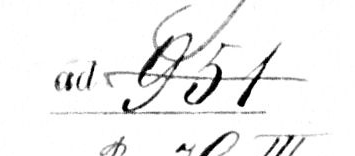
ad 951
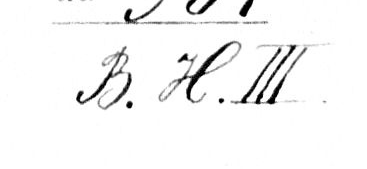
B. H. III
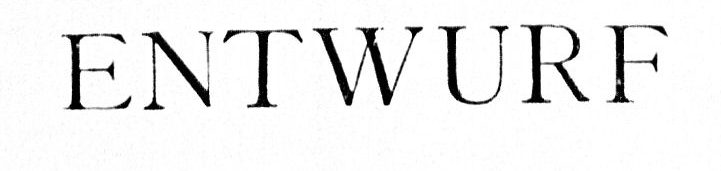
Entwurf
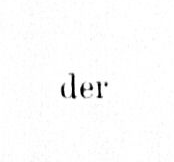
der
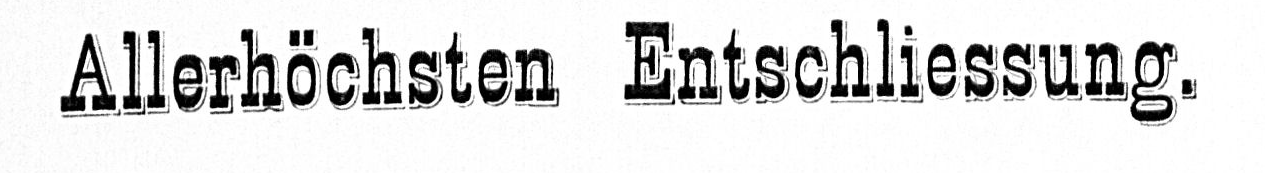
Allerhöchsten Entschliessung.
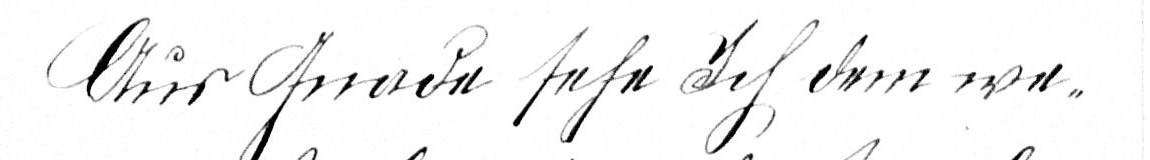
Aus Gnade sehe Ich dem we¬
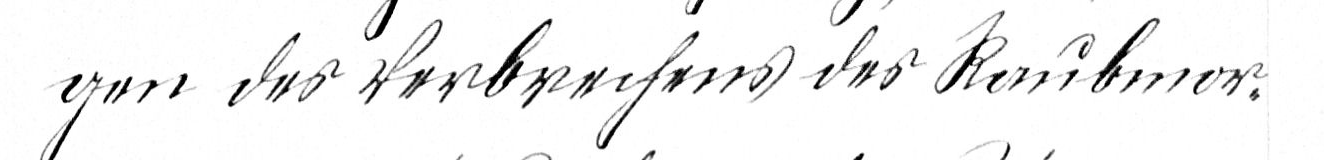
gen des Verbrechens des Raubmor¬
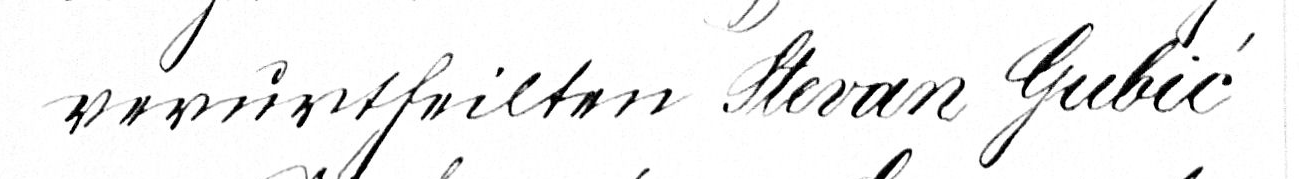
verurtheilten Stevan Gubić
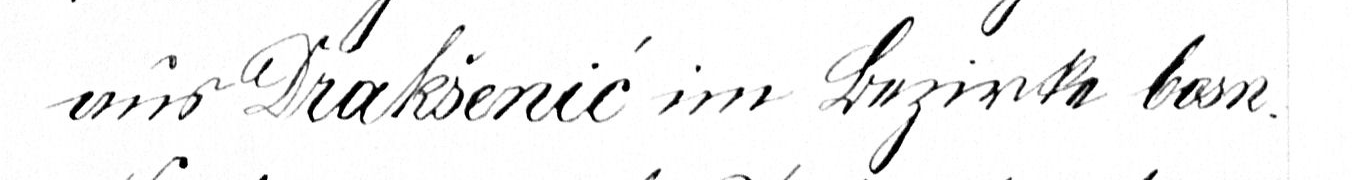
aus Drakšenić im Bezirke bosn.
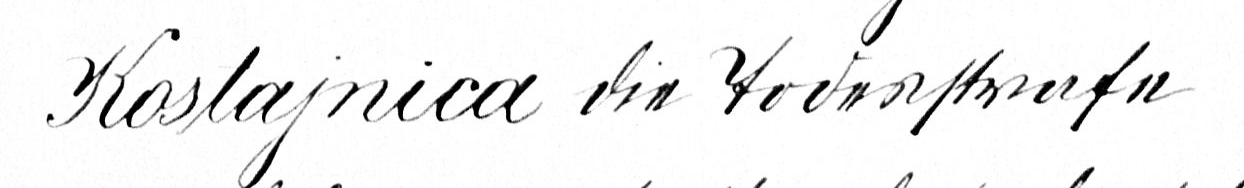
Koslajnica die Todesstrafe
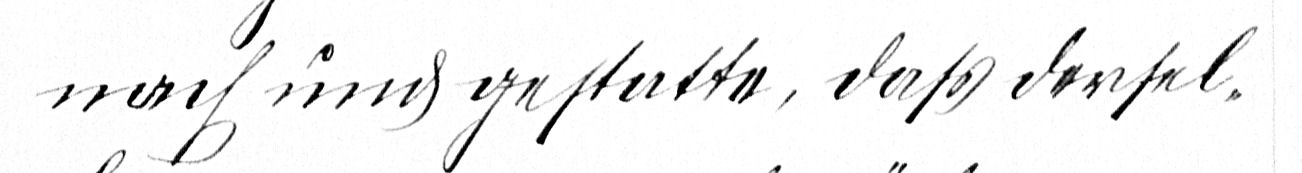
nach und gestatte, daß dersel¬
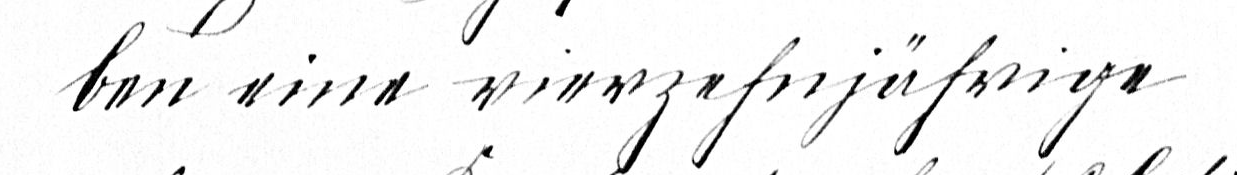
ben eine vierzehnjährige
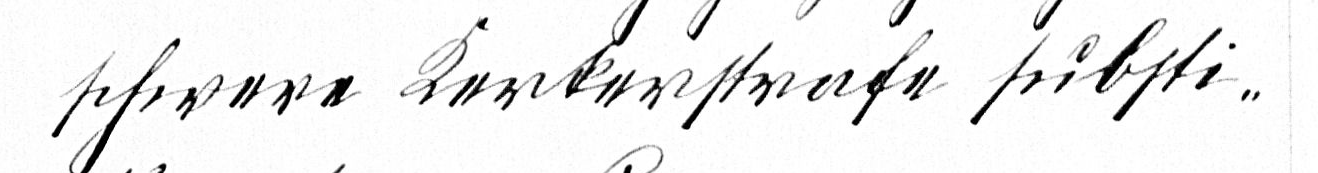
schwere Kerkerstrafe substi¬
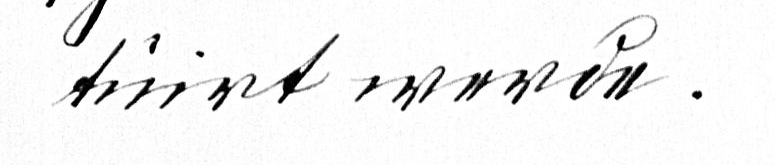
tuirt werde.
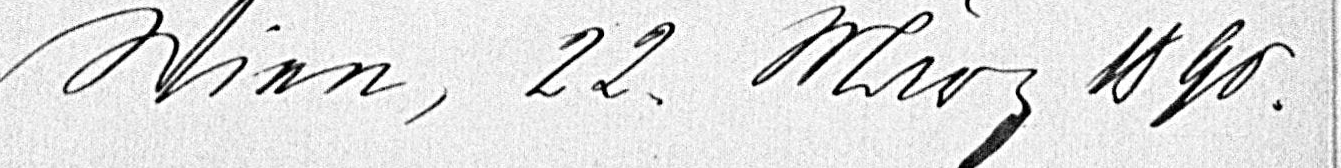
Wien, 22. März 1890.
